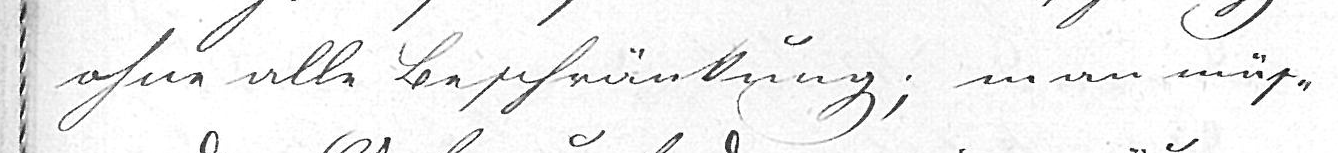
ohne alle Beschränkung; man müs-
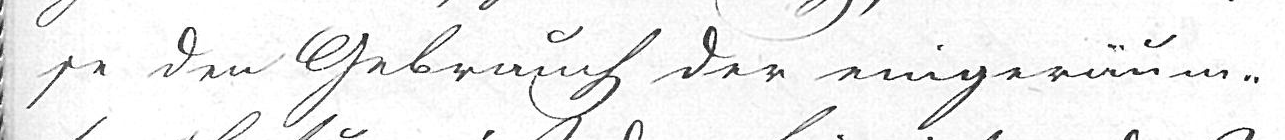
se den Gebrauch der eingeräum-
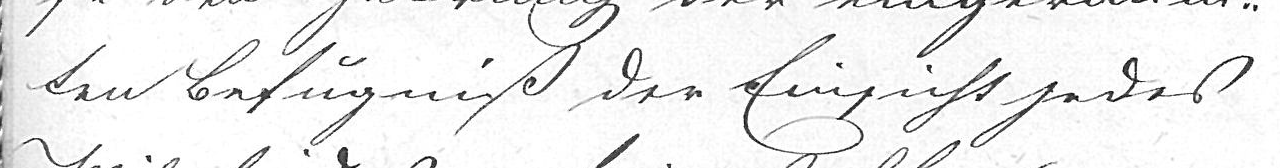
ten Befugniß der Einsicht jedes
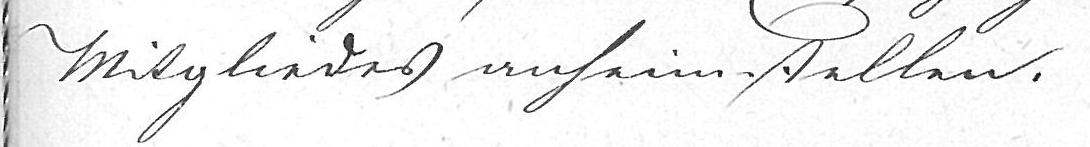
Mitgliedes anheimstellen.
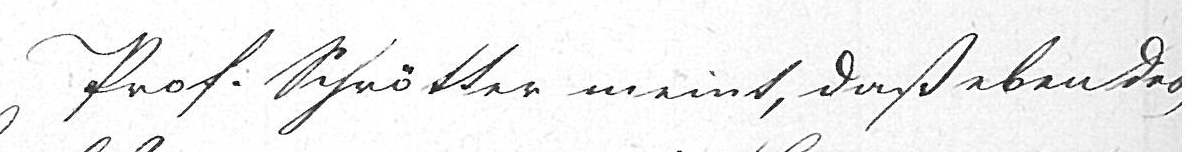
Prof. Schrötter meint, daß eben des
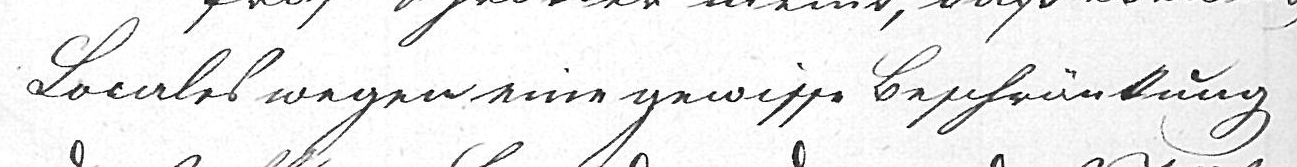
Locales wegen eine gewisse Beschränkung
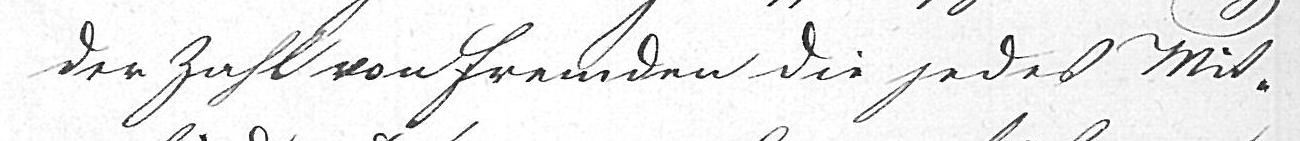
der Zahl von Fremden die jedes Mit-
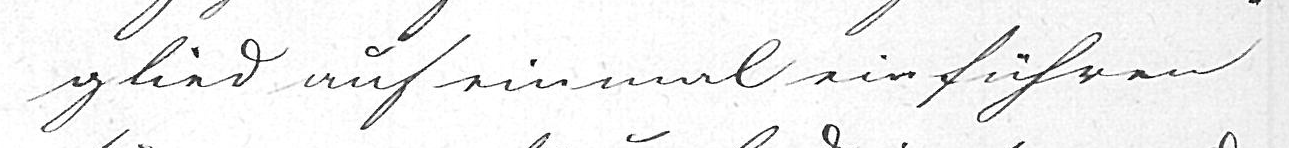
glied auf einmal einführen
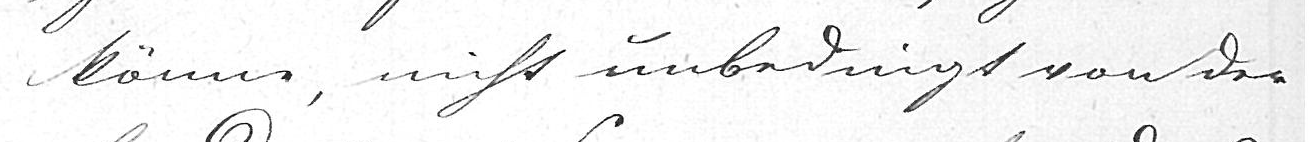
könne, nicht unbedingt von der
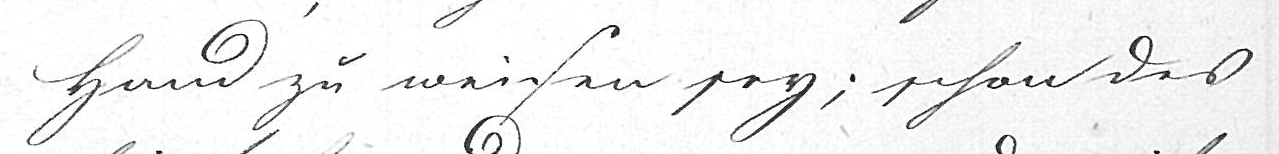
Hand zu weisen sey; schon des
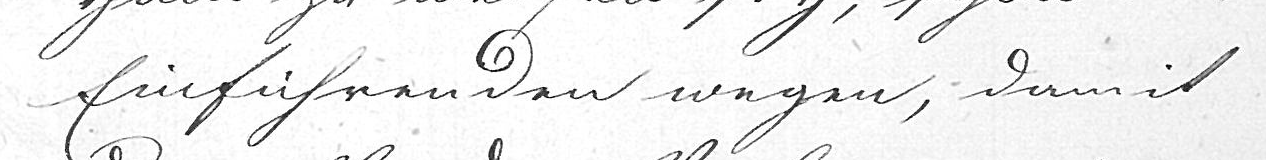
Einführenden wegen, damit
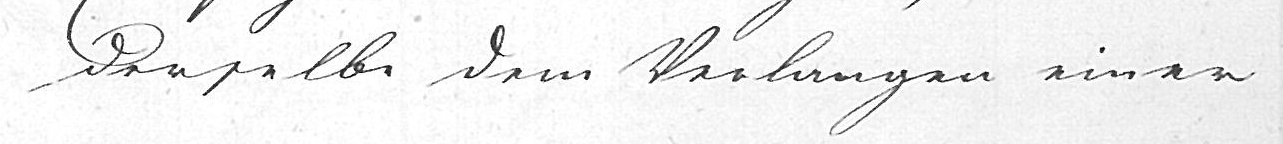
derselbe dem Verlangen einer
